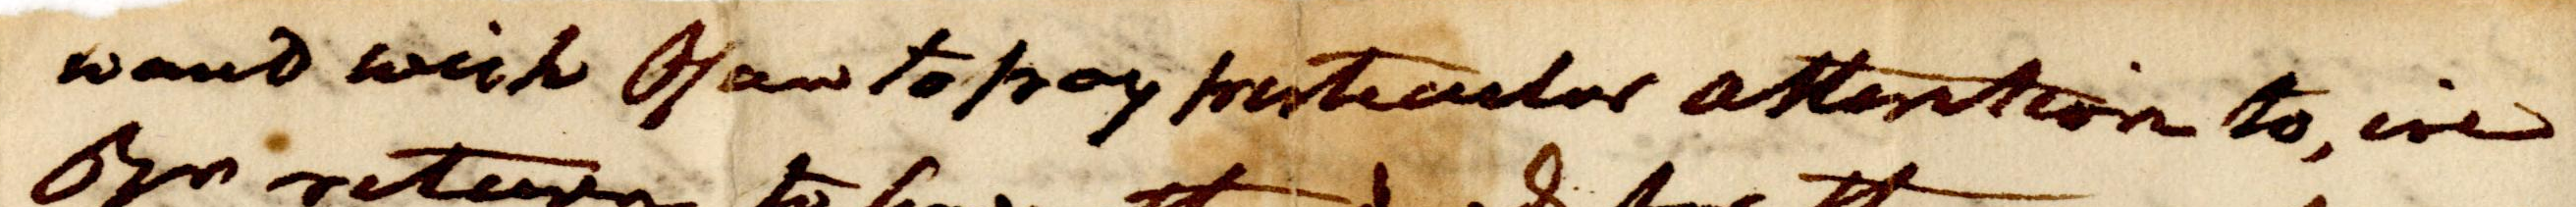woud wish you to pay particular attention to, in
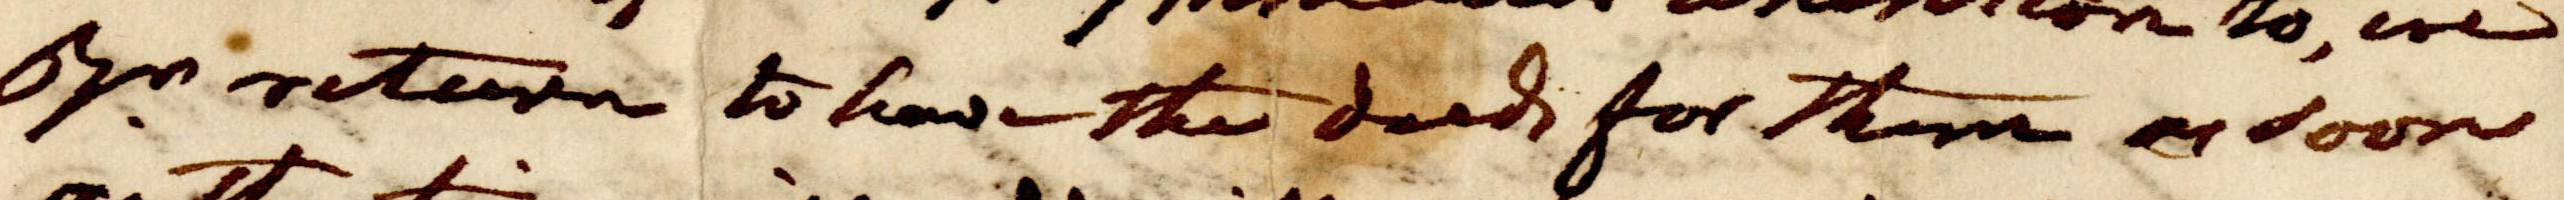Y^r. return to have the deeds for them as soon
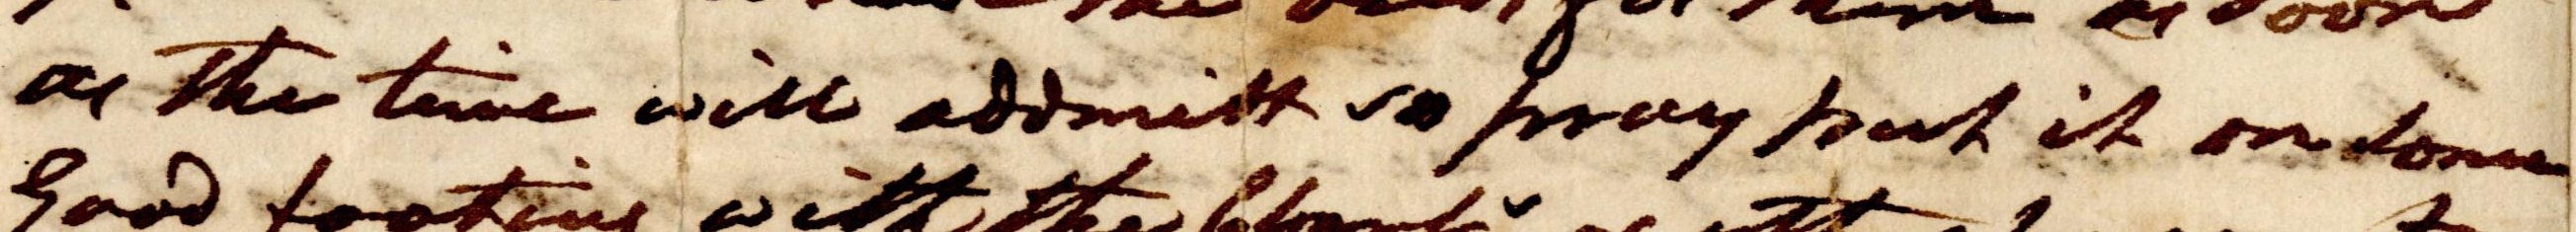as the time will addmitt so pray put it on some
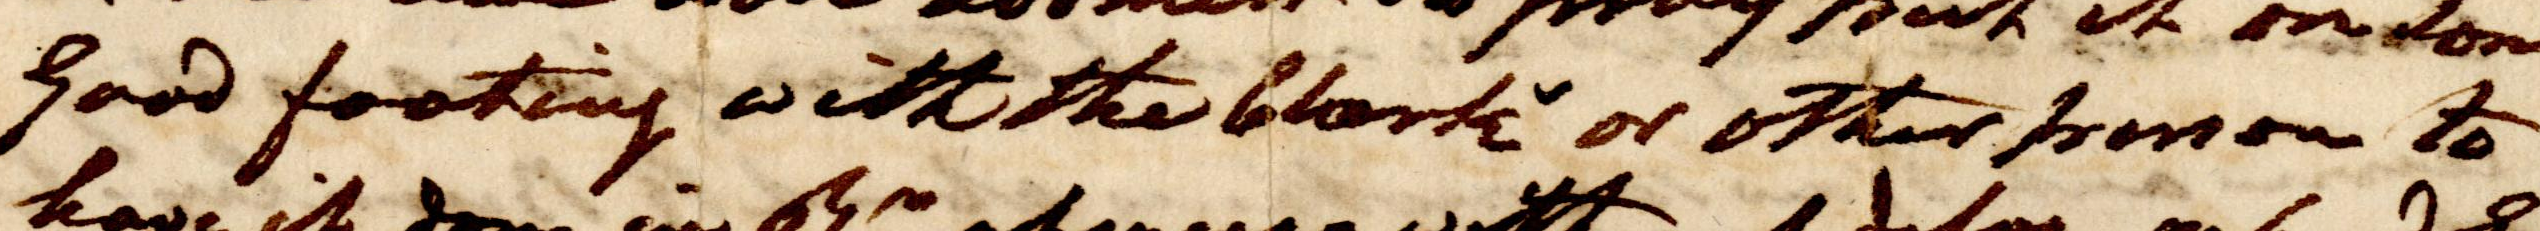Good footing with the Clerk or other person to
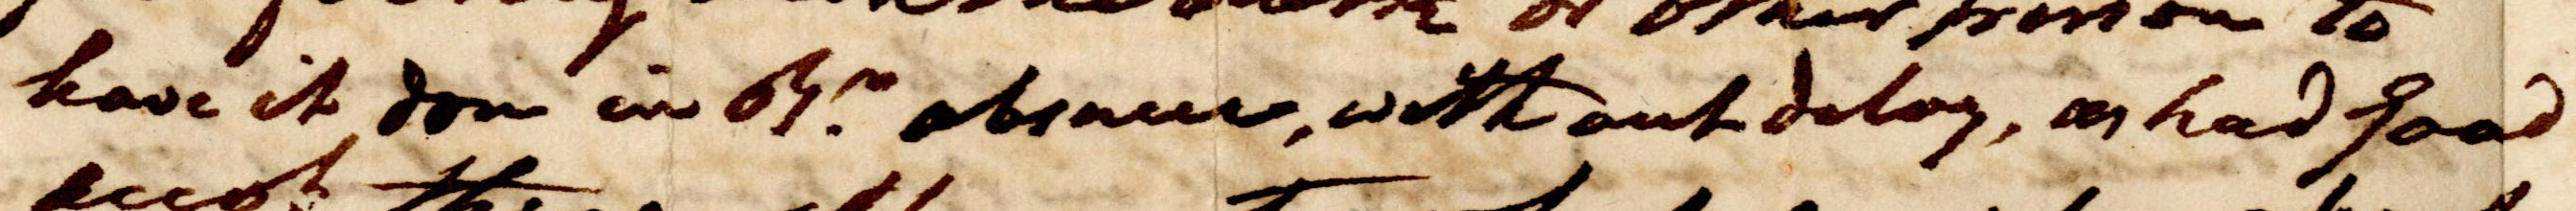have it don in y^r. absence, without delay, as had good
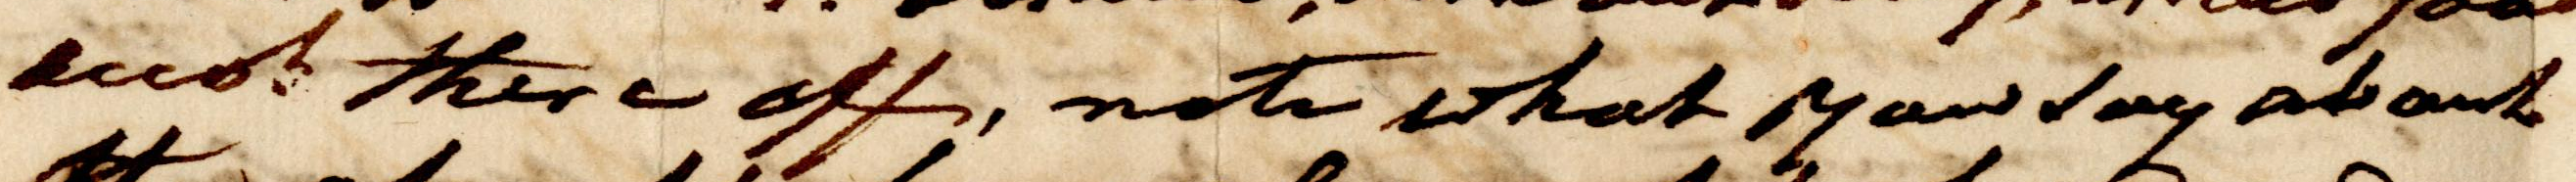acco^t there off note what you say about
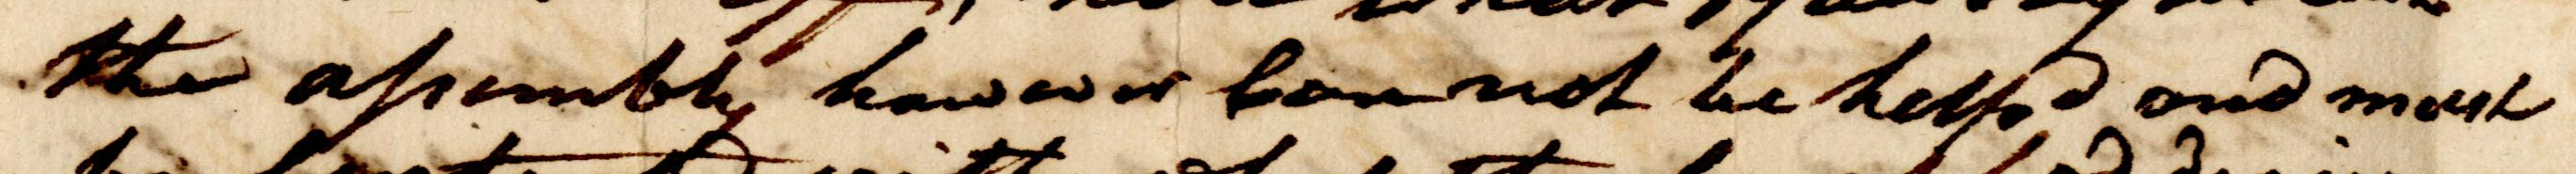the assembly however can not be helpd and must
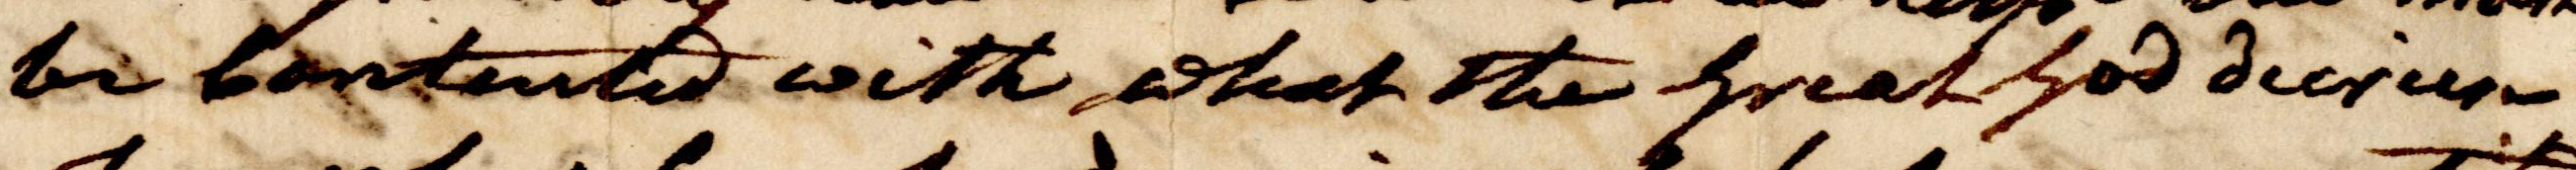be Contented with what the Great God decries
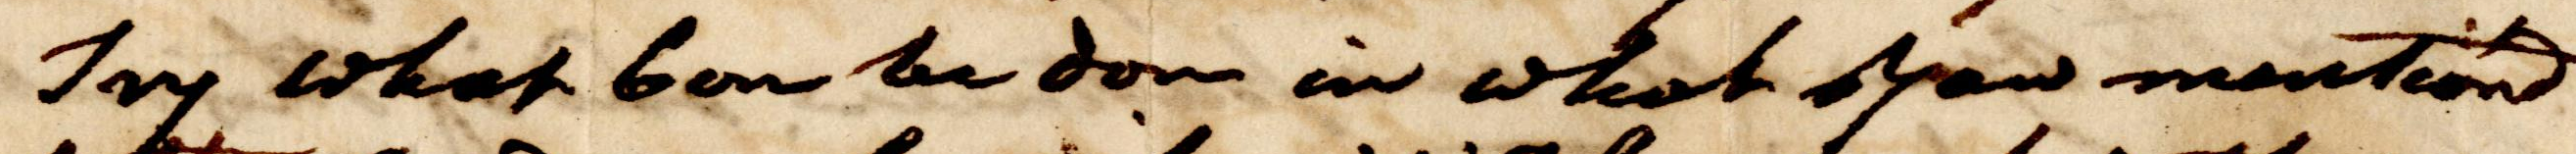Try what can be don in what you mention'd
